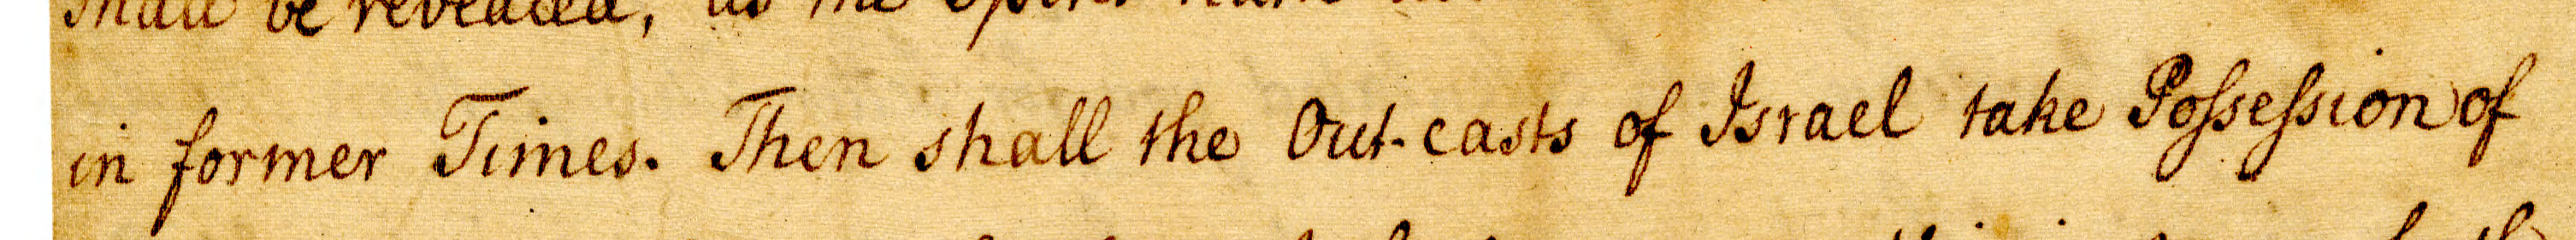in former Times. Then shall the out-casts of Israel take Possession of
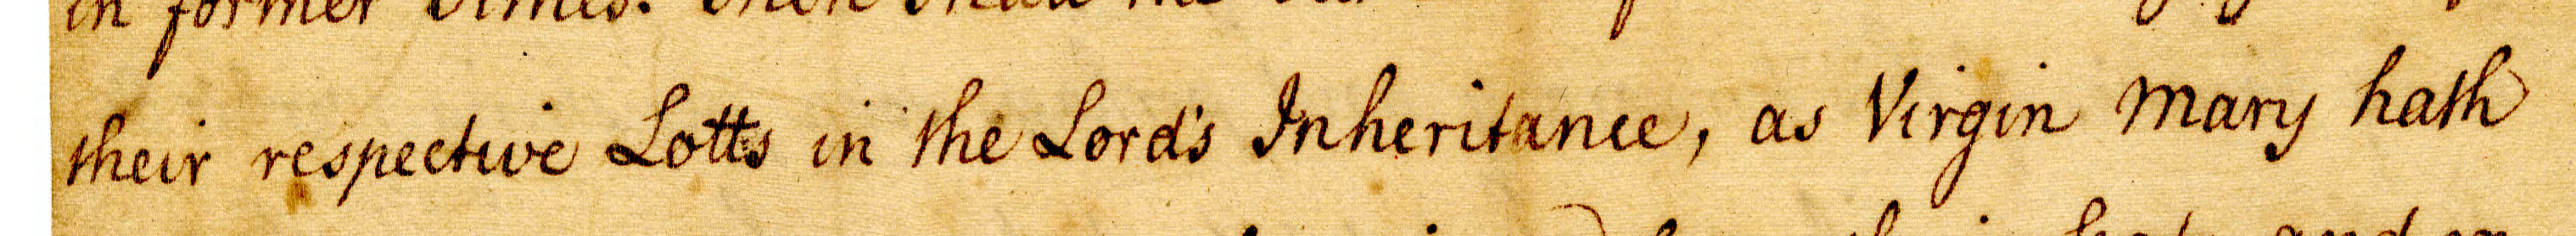their respective Lotts in the Lord’s Inheritance, as Virgin Mary hath
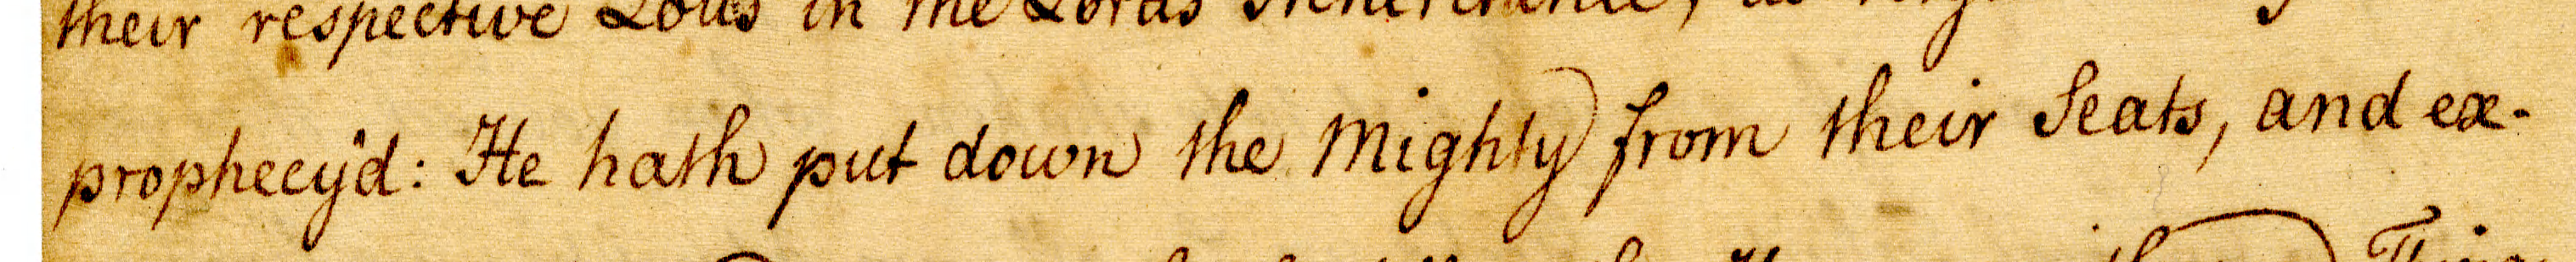prophecy'd: He hath put down the Mighty from their Seats, and ex-
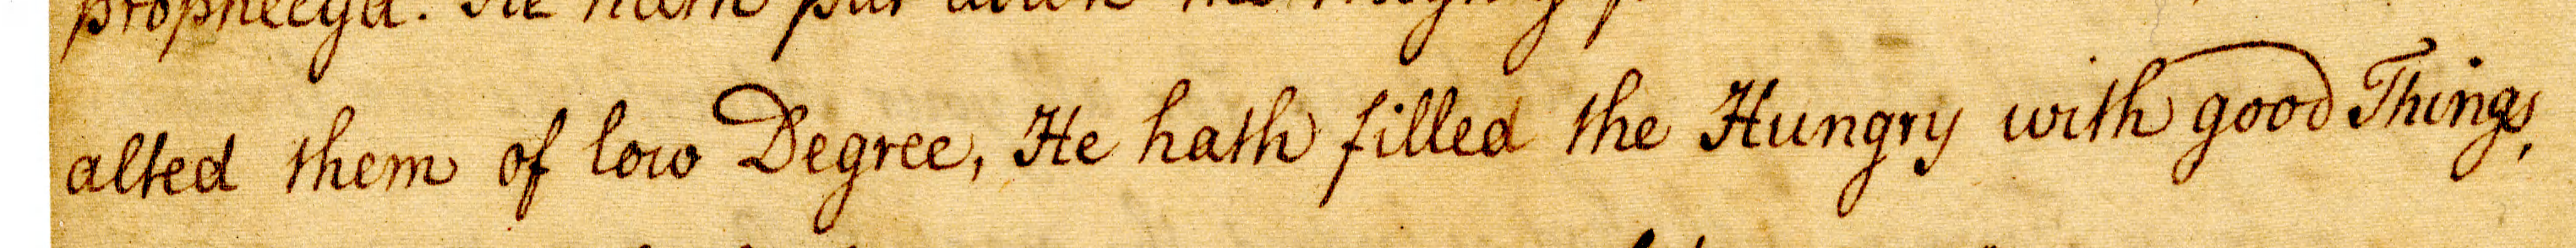alted them of low Degree, He hath filled the Hungry with good Things,
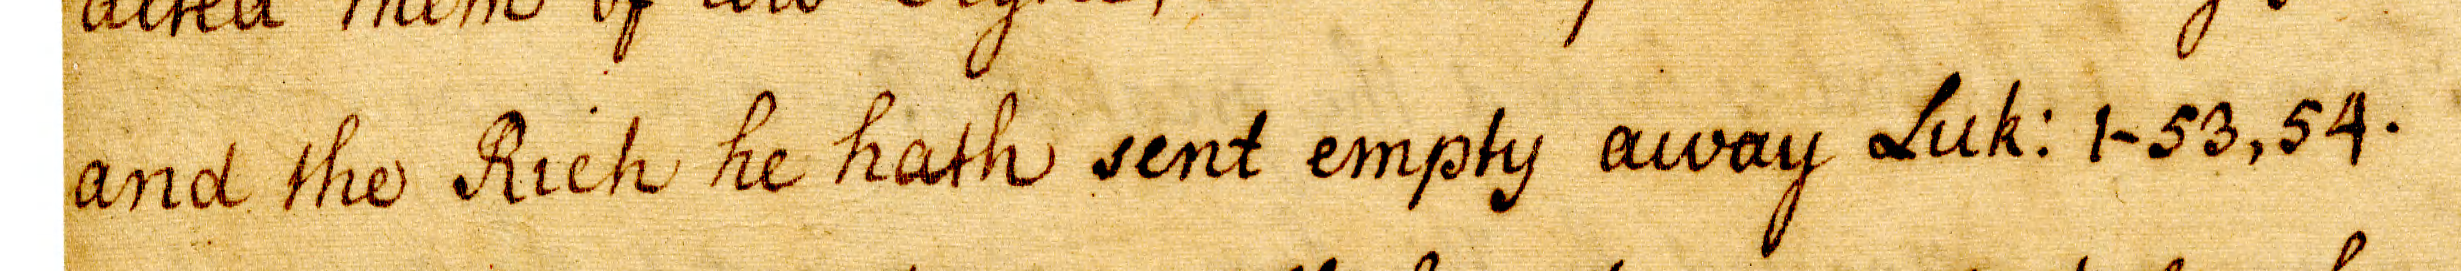and the Rich hath sent empty away Luk: 1-53,54.
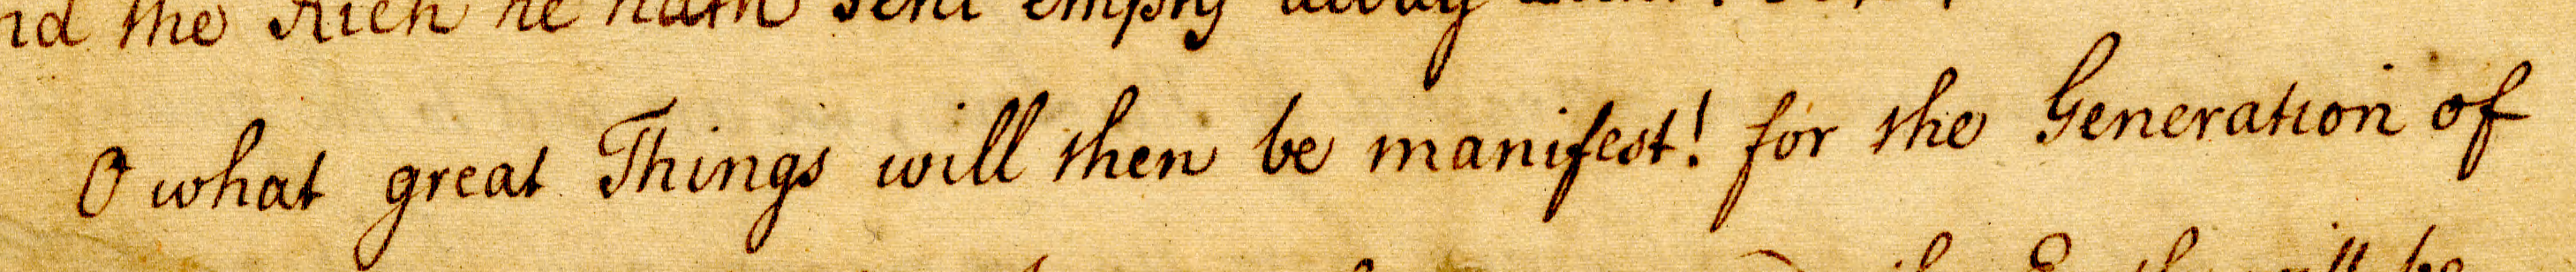O what great Things will then be manifest! For the Generation of
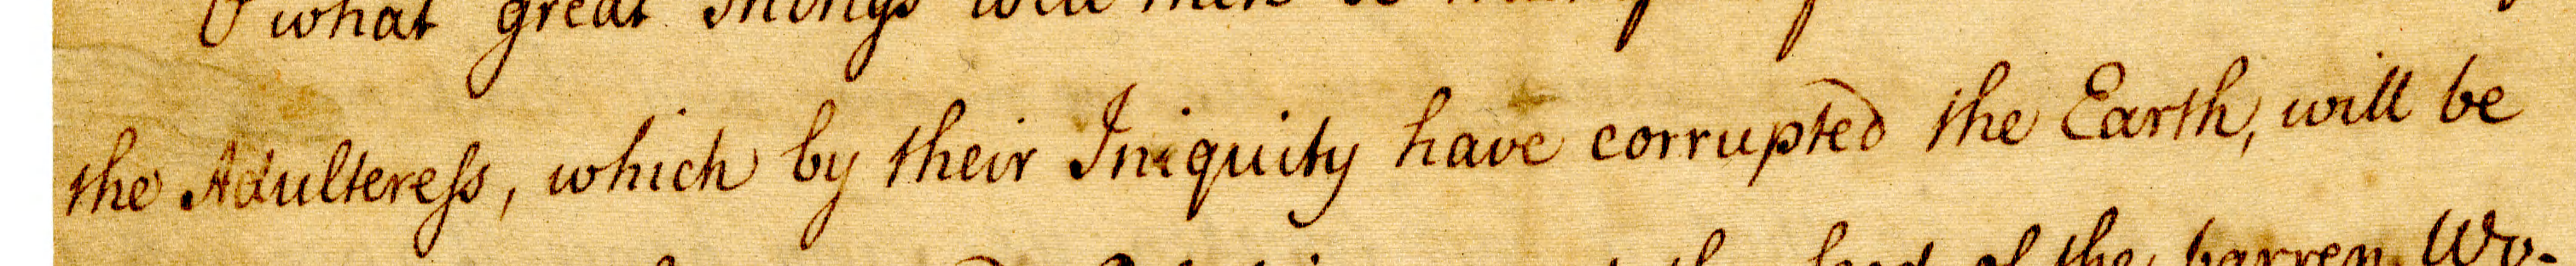the Adulteress, which by their Iniquity have corrupted the Earth, will be
